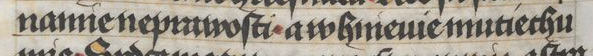namie neprwoſti.a w hnieuie mutíechu
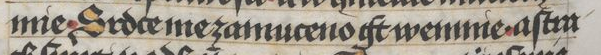mie.Srdte me zamuceno ḡt wemnie.aſtra¬
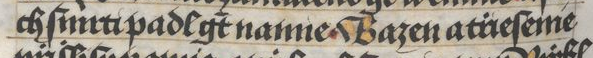ch ſmrti padl ḡt namie.Bazen a třieſeníe
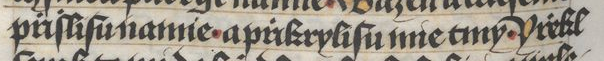pṙiẛliſu namie.a pṙikryliſu mie tmy.Y ṙekl
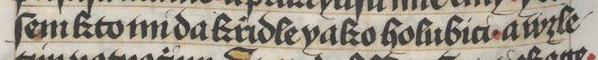ſem kto mi da kṙidle yako holubici.a wzle¬
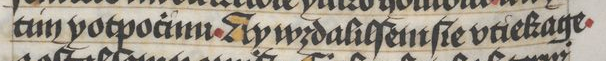tím yotpoċinu.Ay wzdalilſem ſie vtiekage.
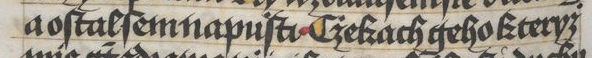a oſtal ſem napuẛti.Cżekach geho kteryż
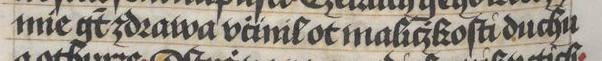mie ḡt zdrawa vċinil ot malicżkoſti duchu
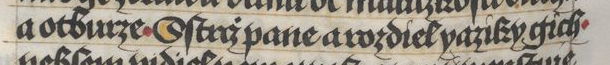a otburze.Sſtrcż pane a rozdiel yaziky gich.
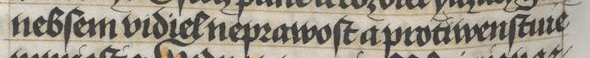nebſem vidiel neprawoſt a protiwenſtuíe
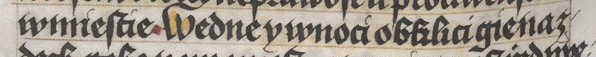wmieſtie.Wedne y wnoci obklici giena z¬
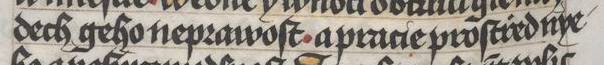dech geho neprawoſt.a pracie proſtṙed nye¬
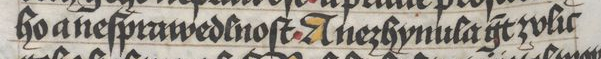ho a neſprawedlnoſt.A nezhynula ḡt zvlic
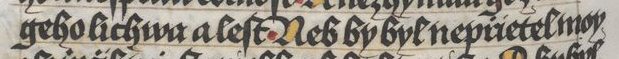geho lichwa a leſt.Neb by byl nepṙietel moy
